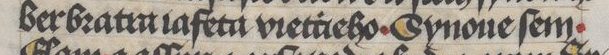ber bratra iaſeta vietċieho.Synoue ſem.
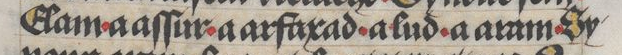Elam.a aſſur.a arfaxad.a lud.a aram. Sy¬
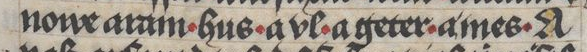nowe aram. hus.a vl.a geter.ames. A
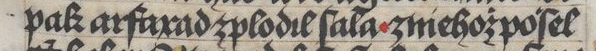yak arfarad zplodil ſala.zniehoż poẛel
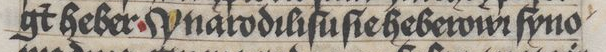ḡt heber.Ynarodiliſu ſie heberowi ſyno¬
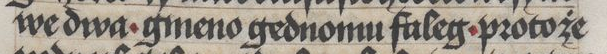we dwa.gmeno gednomu faleg.proto że¬
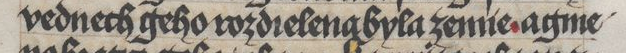vednech geho rozdíelena byla zemie.a gme¬
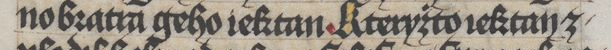no bratra gehy iektan.Kteryżto iektan z¬
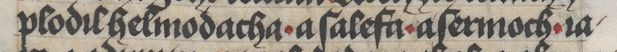plodil helmodacha.a ſalefa.a ſermoch.ia¬
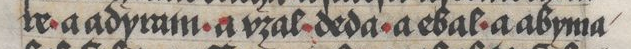de.a adyram.a vzal.deda.a ebal.a abyma¬
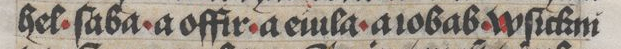hel.ſaba.a offir.a euila.a iobab.Wẛickni
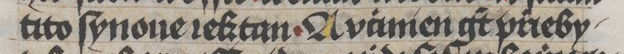tito ſynoue iektan.A vċiníen ḡt pṙieby¬
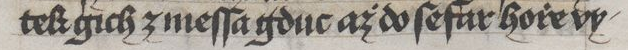tek gich z meſſa gduc aż do ſefar hoṙe vy¬
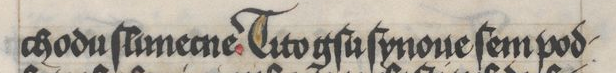chodu ſlunecne.Tito gſu ſynoue ſem pod¬
